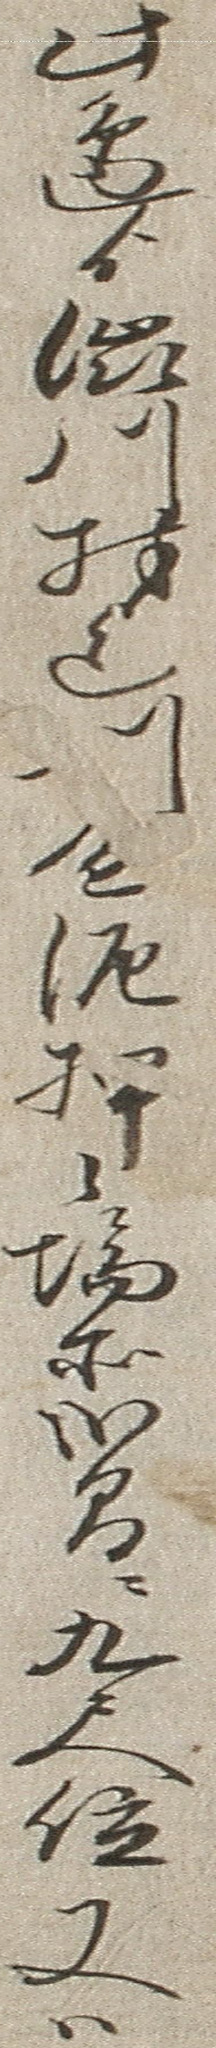此辺ゟ渋川村迄川通泥押之場所弐間に九尺位又は
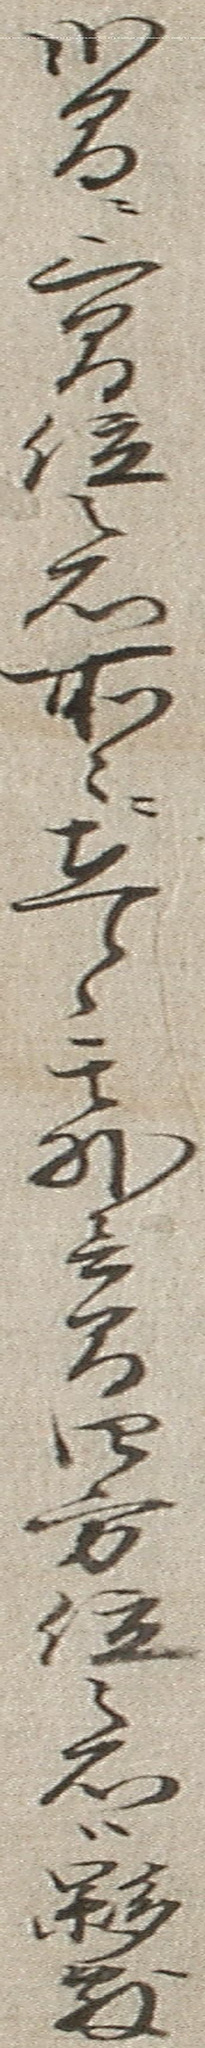弐間に三間位の石所々に在之候其外壱間四方位之石は夥敷
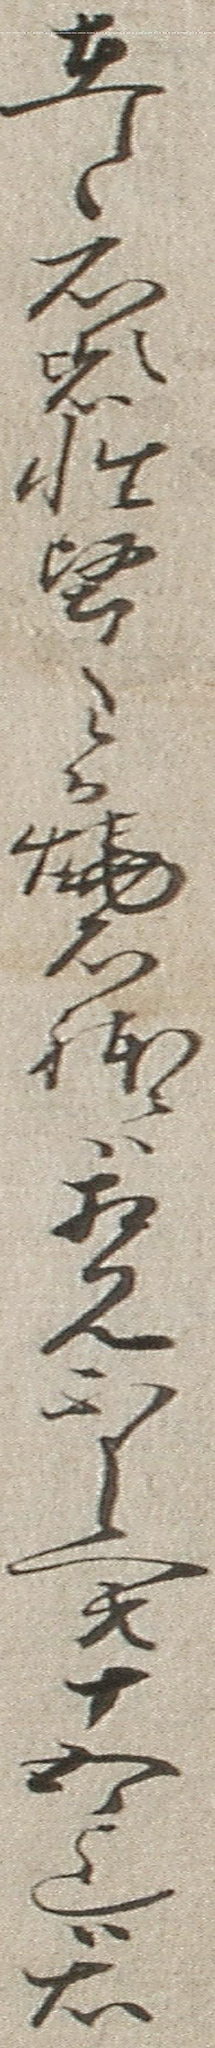在之候石之岩性堅くに而焼石体には相見不申候へ共十五日迄は右
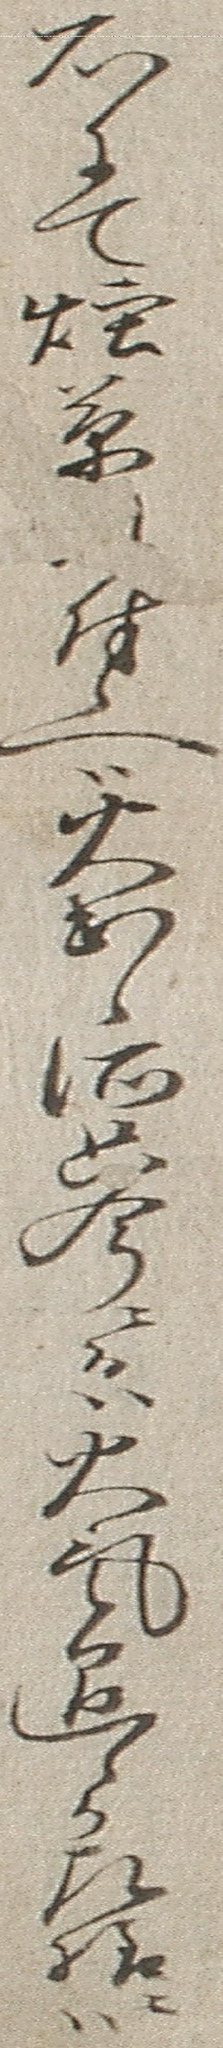石にて煙草に？付候へは火出候所只今に而は火気退候か左様には
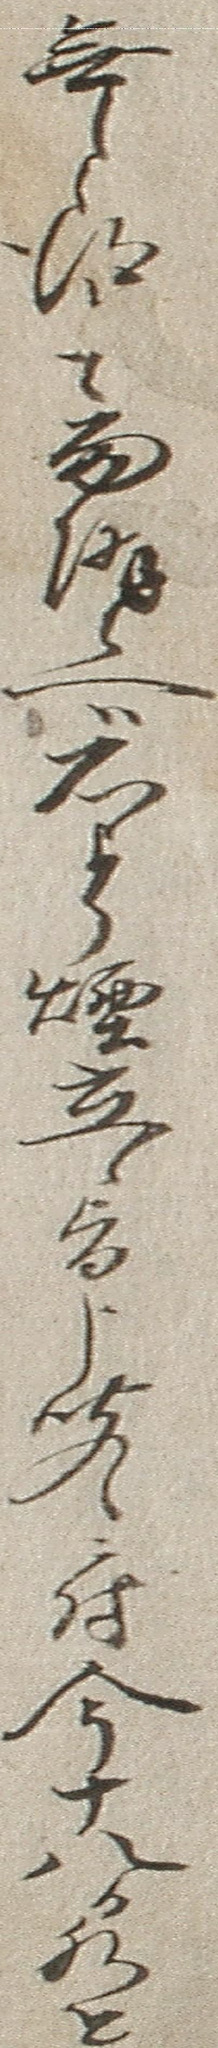無之候得共雨降候へは石より煙立候旨申聞候に付今十八日水を
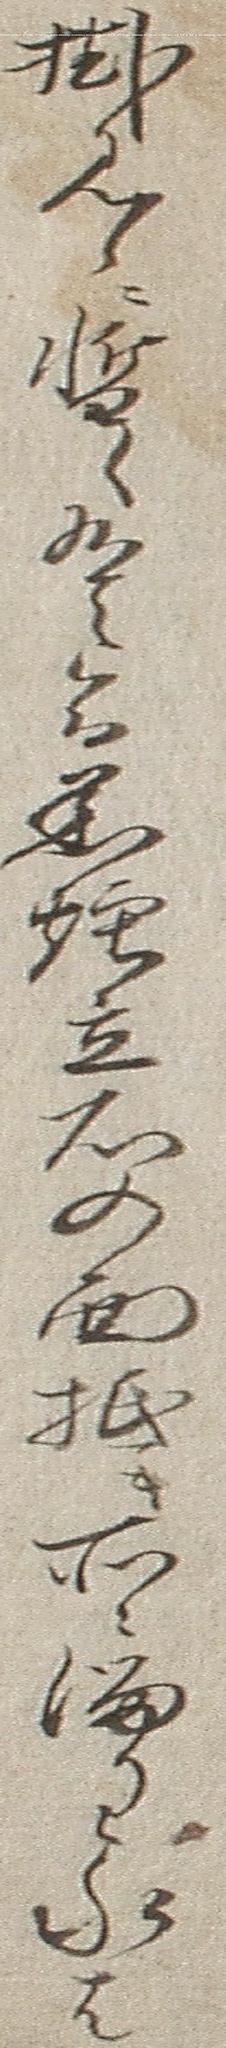掛見候に暫く有之候而黒煙立石の面低き所に溜候水者
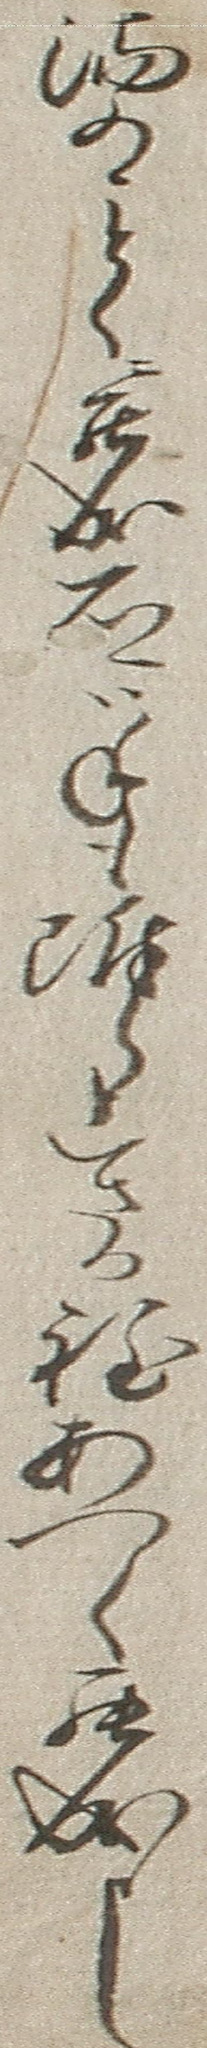湯のことくに罷成石は手も附られさる程あつく罷成申候

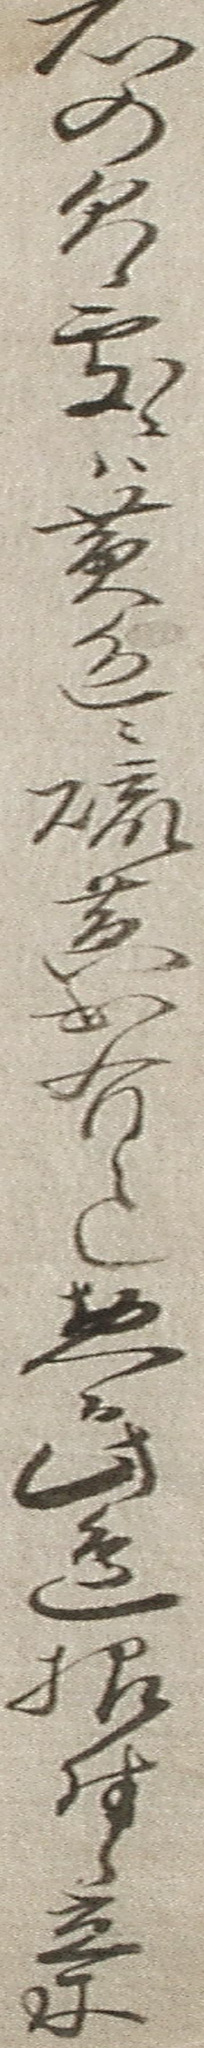石の欠候処には黄色に硫黄出有之惣而此辺根付候立木
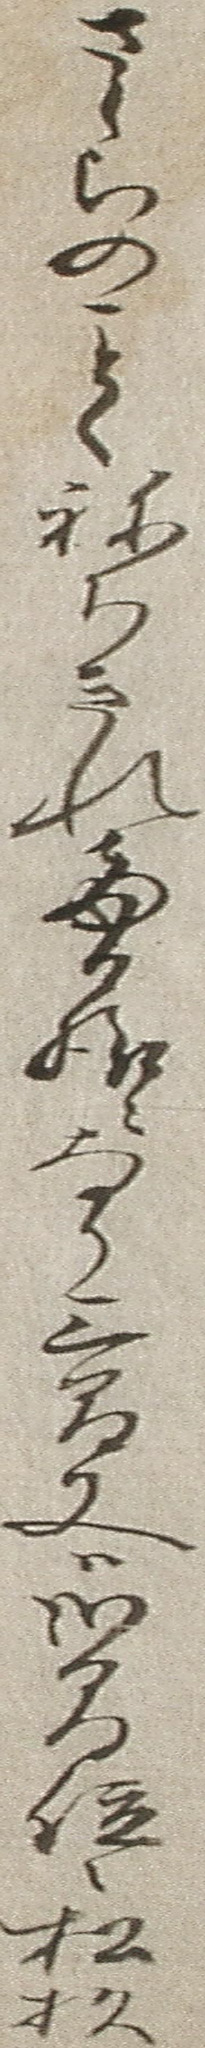さゝらのことくねちきれたる様になり三間又は弐間位之松杉
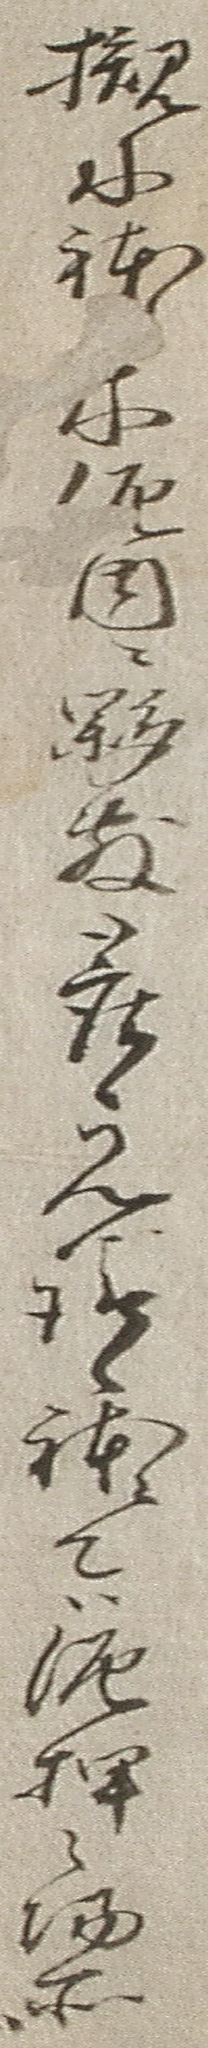槻木体の木泥内に夥敷御座候見致候体にては泥押之場所は
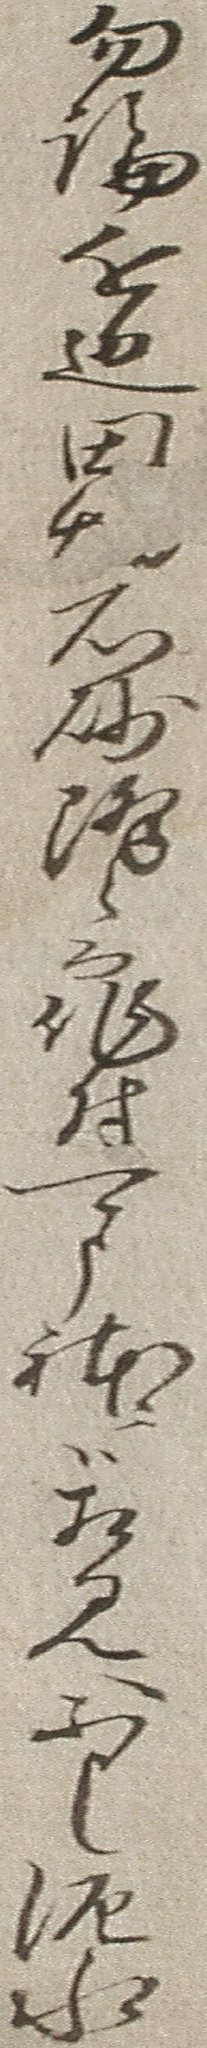勿論近辺田畑石砂降候而作付可申体には相見へ不申候泥水
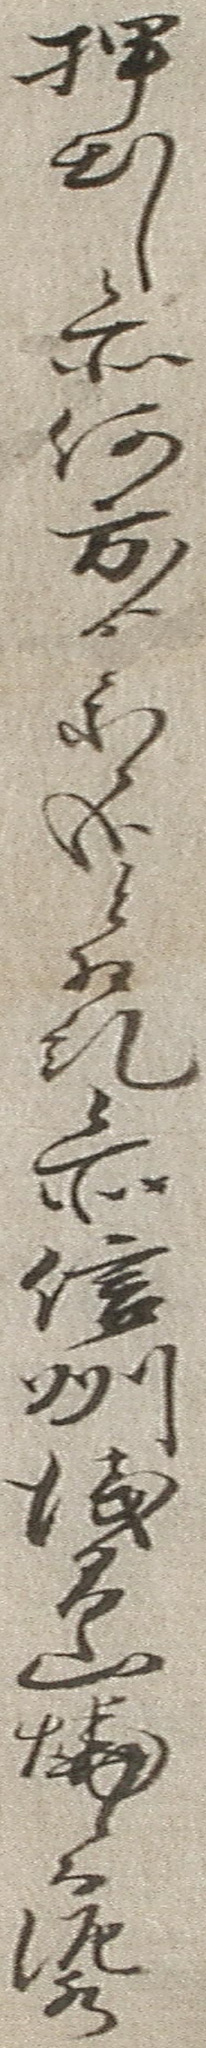押出候所何方ゟ参候哉と相糺候所信州浅間山焼候而泥水
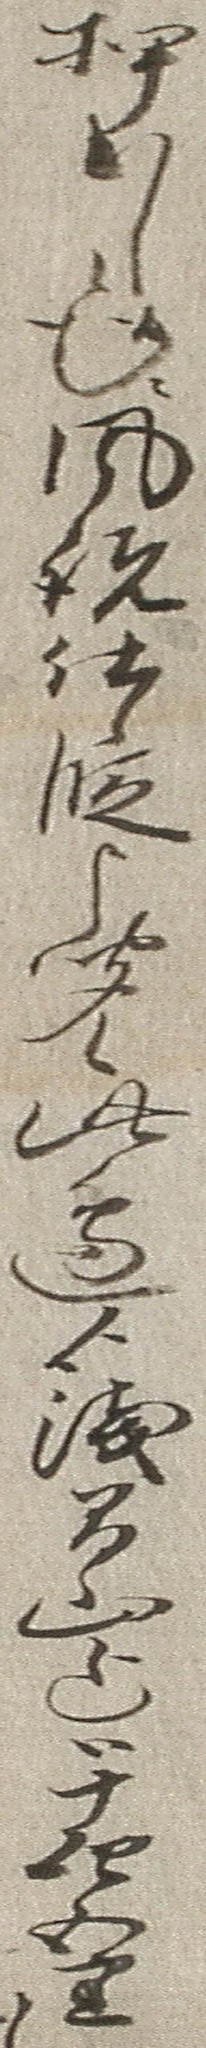押出し候趣に風説仕候段申聞候此辺ゟ浅間山迄は十四五里も
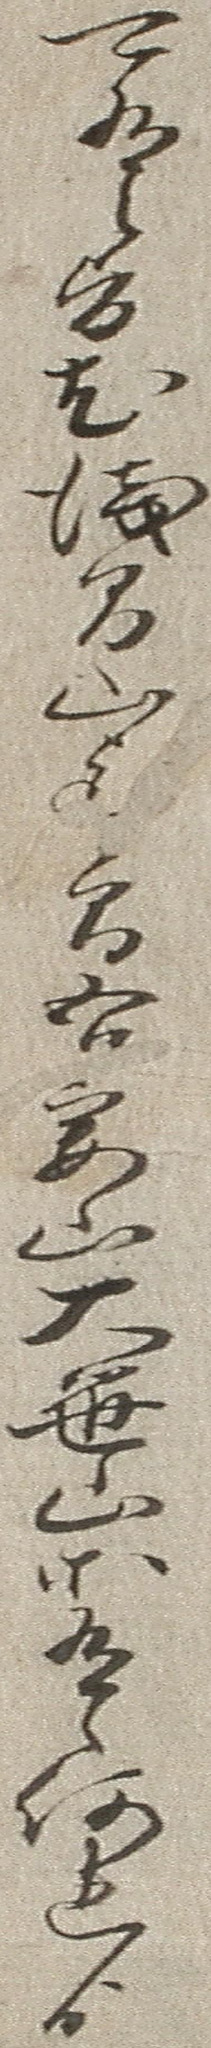可有之候旨尤浅間山迄之間吾妻山大笹山等有之何れゟ
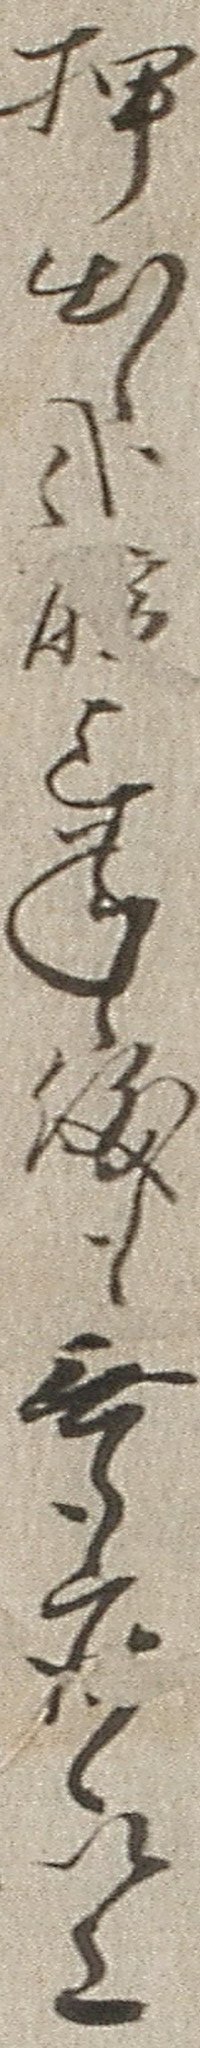押出候哉聢と承候儀も無御座候以上
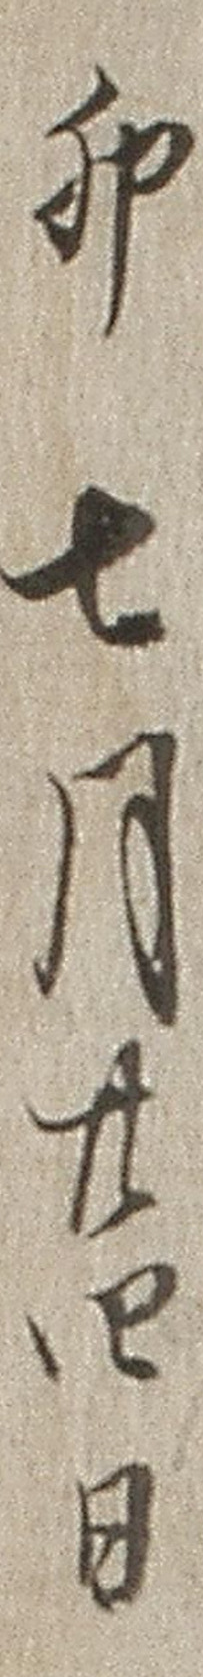卯七月廿四日
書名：太平秘録抜書　浅間山燒及普賢山崩
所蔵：東京大学地震研究所図書室 Earthquake Research Institute Library, The University of Tokyo, JAPAN
